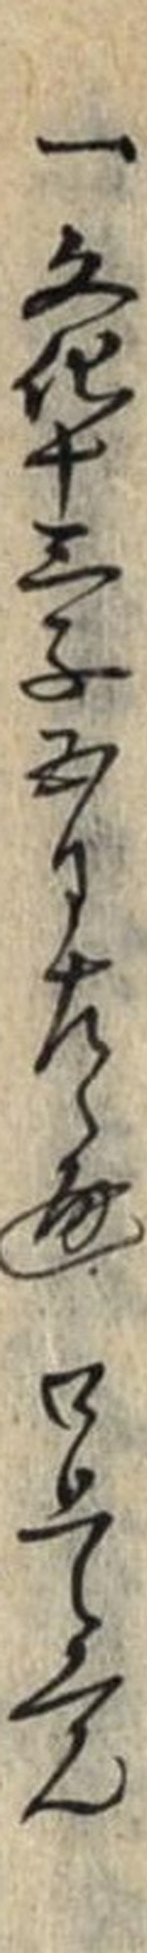一文化十三子正月左之通口上之覚
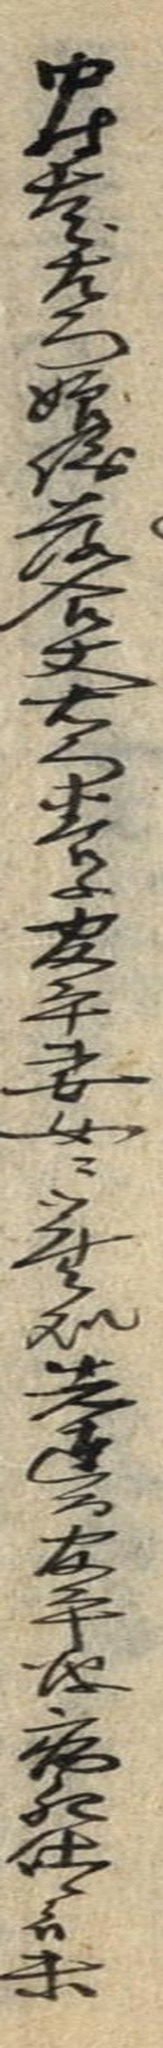中村太郎左衛門娘儀落合文右衛門養子官平妻女ニ御座候処先達而官平儀病死仕候ニ付未
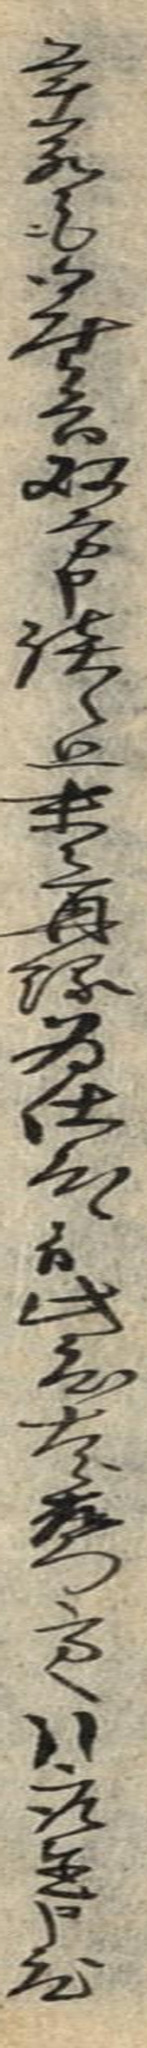年若ニも御座候間双方申談之上末々再縁為仕度候ニ付此度太郎左衛門方へ引取置申度
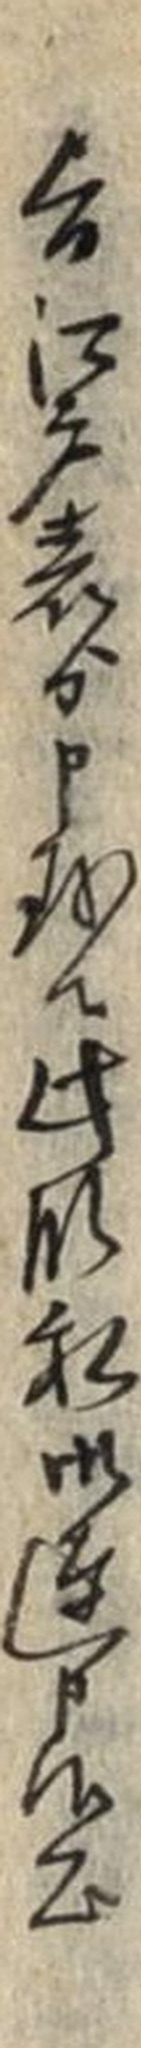旨江戸表ゟ申越候此段私御達申候以上
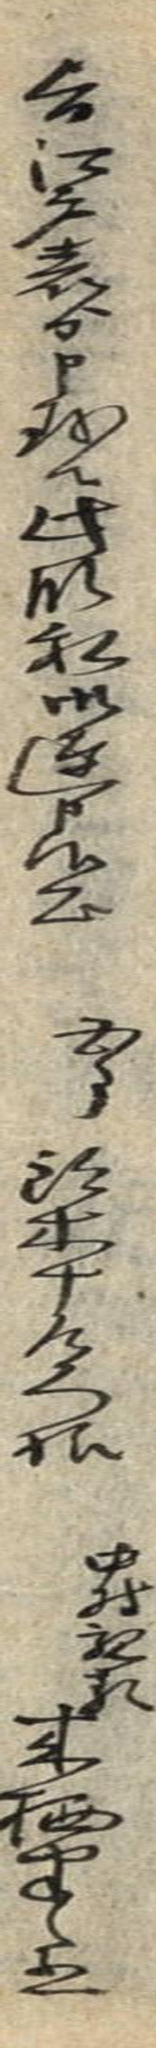旨江戸表ゟ申越候此段私御達申候以上
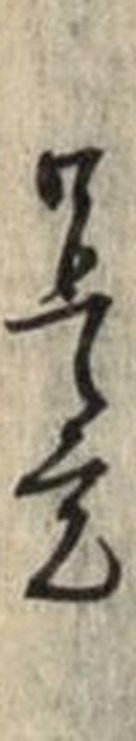口上之覚
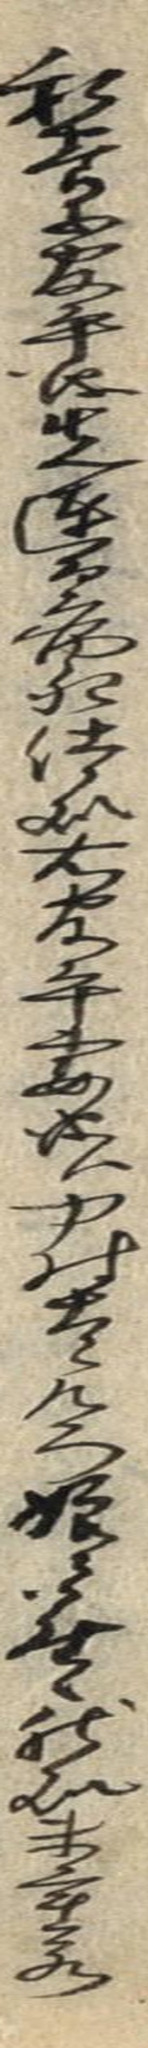私養子官平儀先達而病死仕候処右官平妻儀ハ中村太郎左衛門娘ニ御座候然処未年若
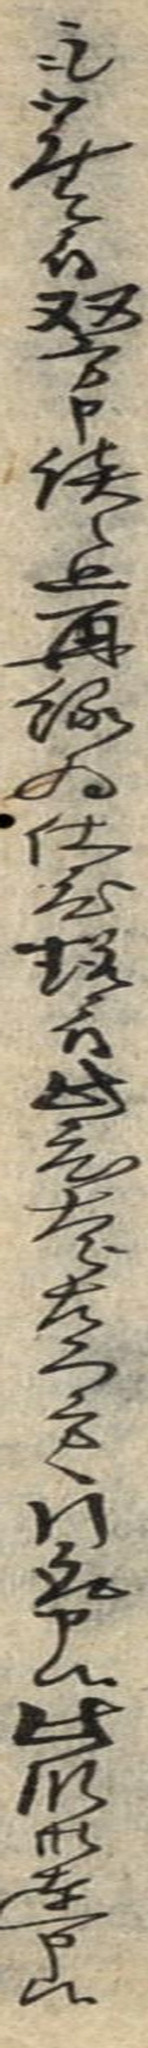二も御座候ニ付双方申談候上再縁為仕度趣ニ付此度太郎左衛門方へ引取申候此段御達申候
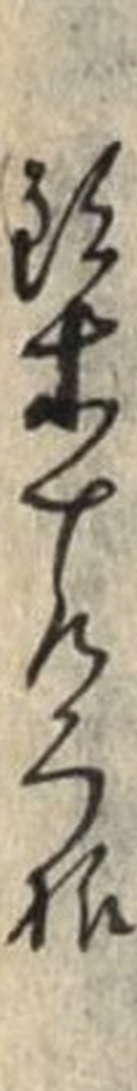鈴木十左衛門様
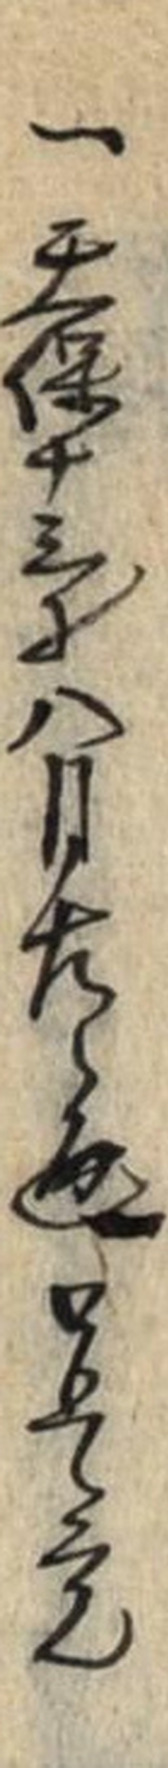一天保十三刁八月左之通口上之覚
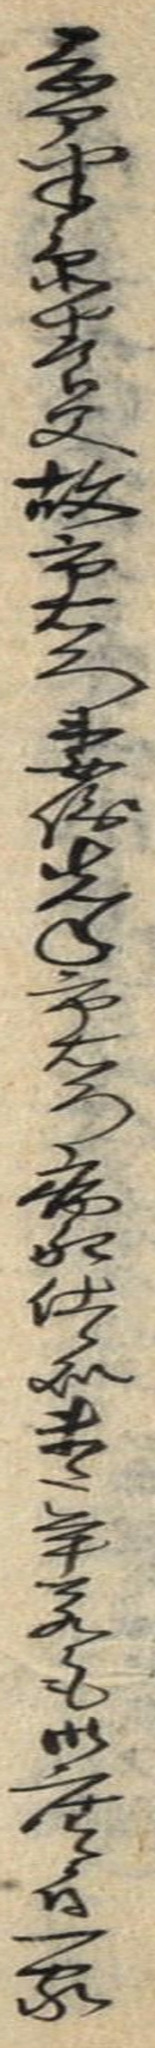岡部半兵衛養父故市右衛門妻儀先年市右衛門病死仕候処未た年若ニも御座候ニ付一家

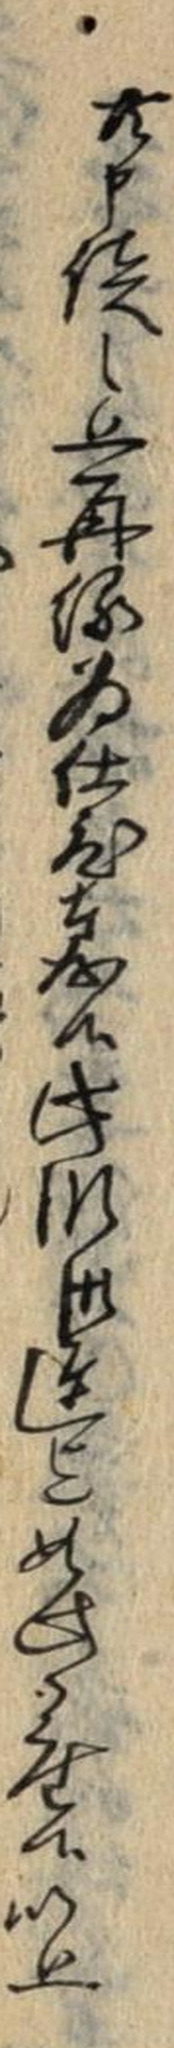共申談之上再縁為仕度奉存候此段御達迄如此御座候以上
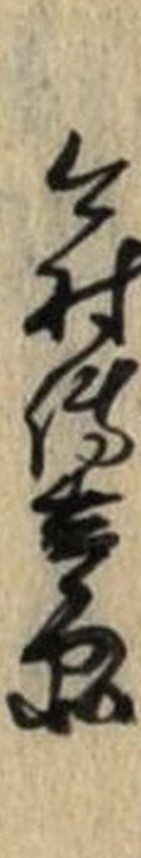今村伝兵衛
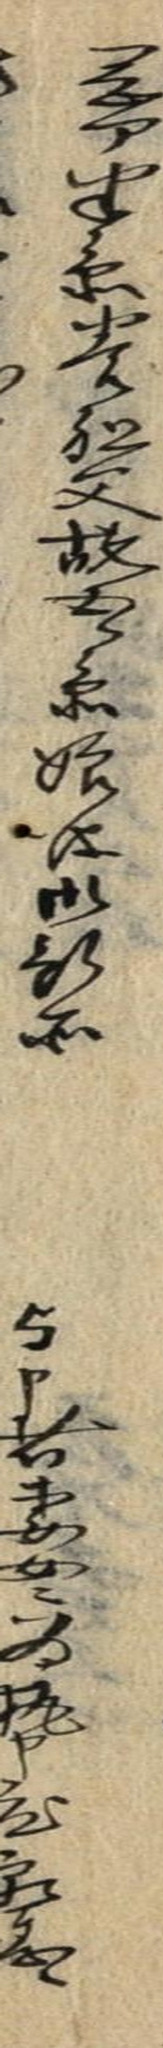岡部半兵衛養祖父故五郎兵衛娘儀御預所と申者妻女ニ為執申度願奉存候
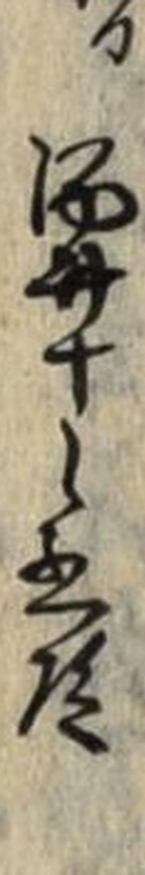酒井十之丞殿
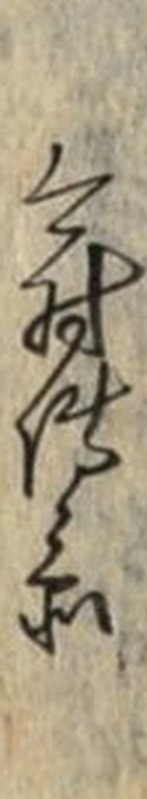今村伝兵衛
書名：養子縁組之部
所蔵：福井県文書館 Fukui Prefectural Archives
